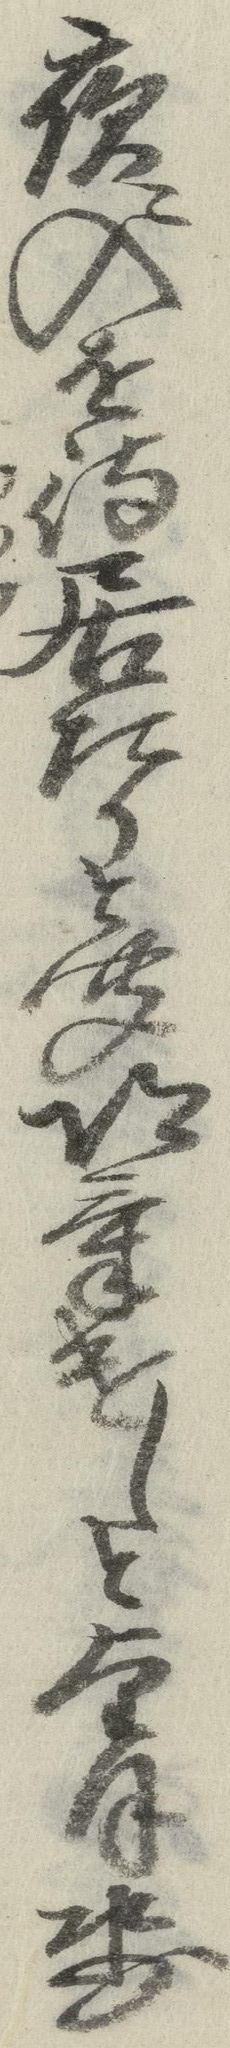夜に入を待居たりと聞跡気遣しと望月決
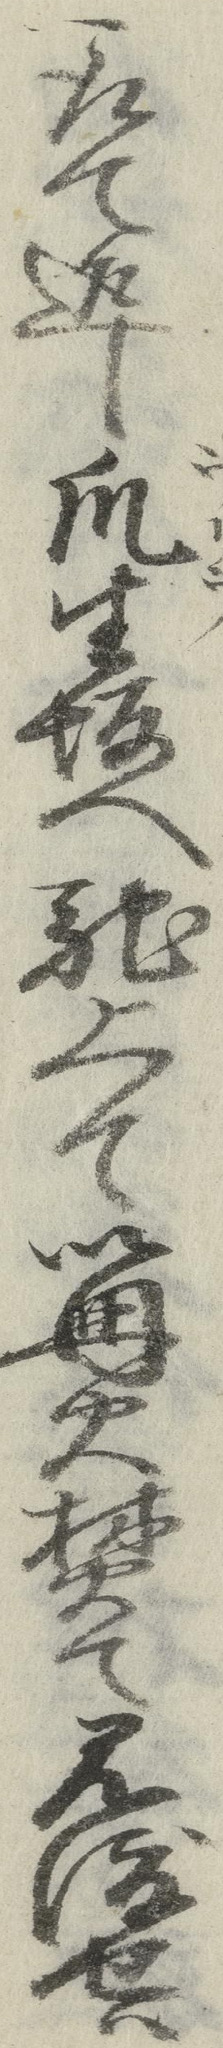取て返し瓜生坂へ馳上て篝火焚て見渡せは
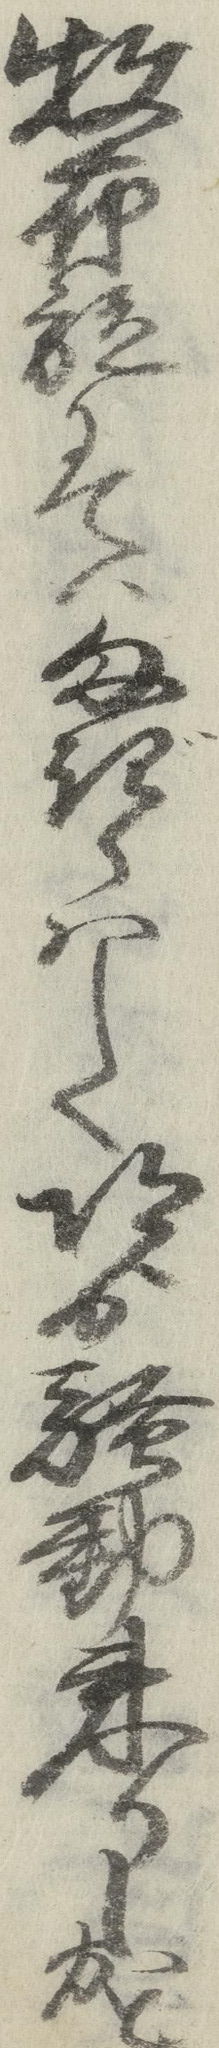牧布施にてはまぎらはしく跡ゟ騒動来りしかと
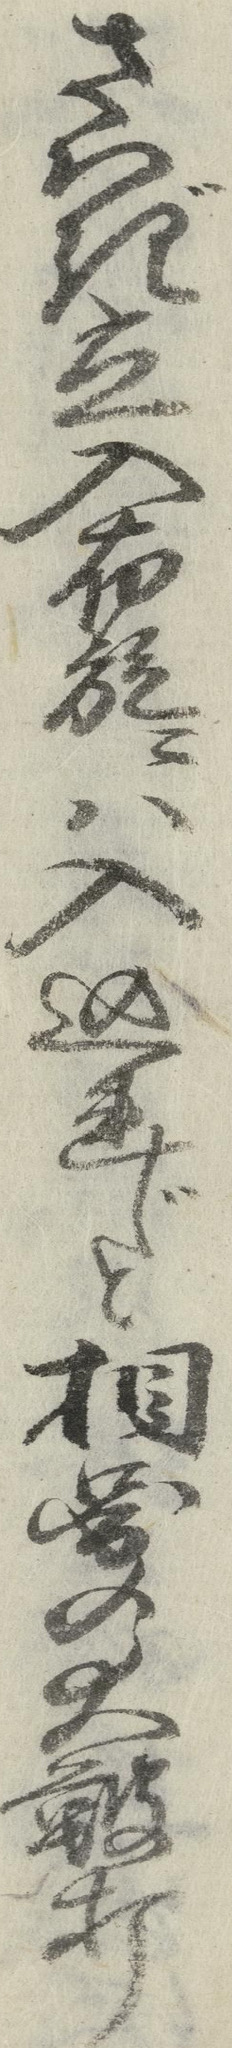さはぎ立入布施には入込れじと相図の大鞁打
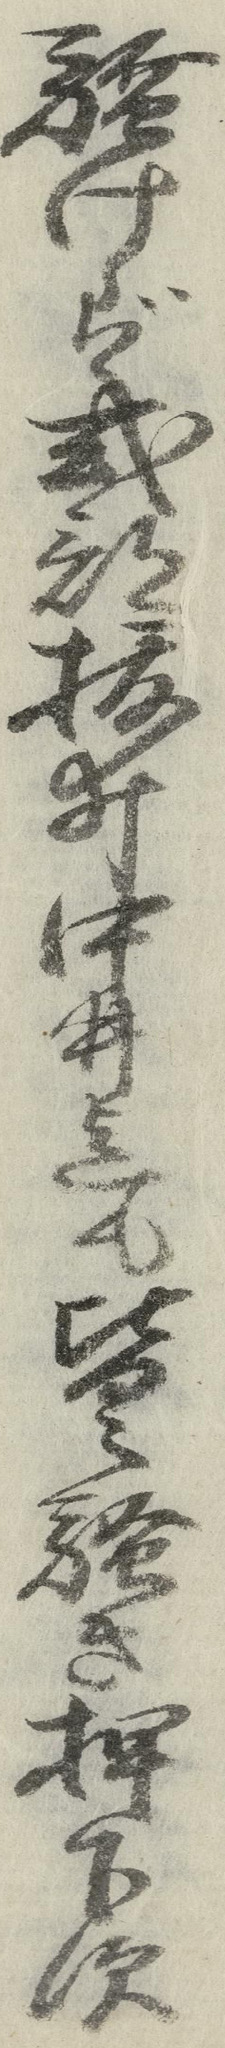騒けぞ弐部抜井中井迄も皆々騒き押下次
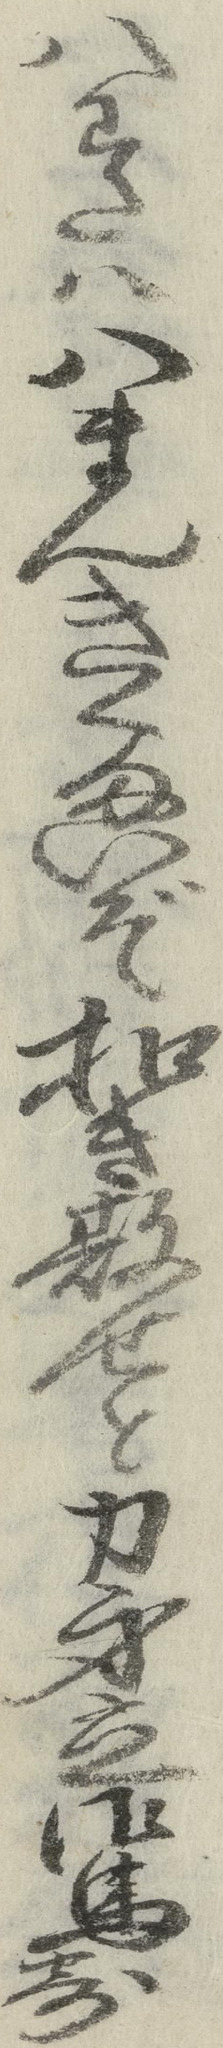八わたは八まんきくまいぞ扣き散せと力身立御馬寄

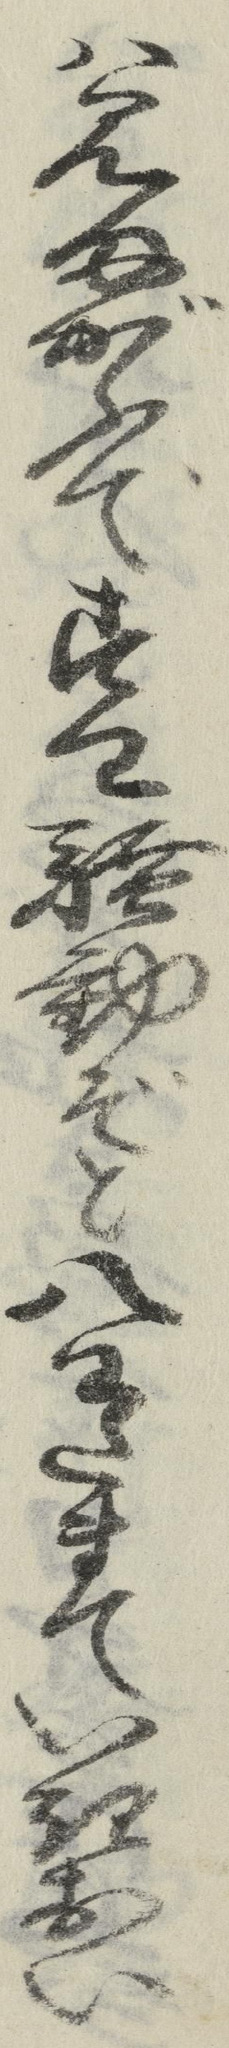は見まがふてすわ騒動ぞと八わたまていきおい
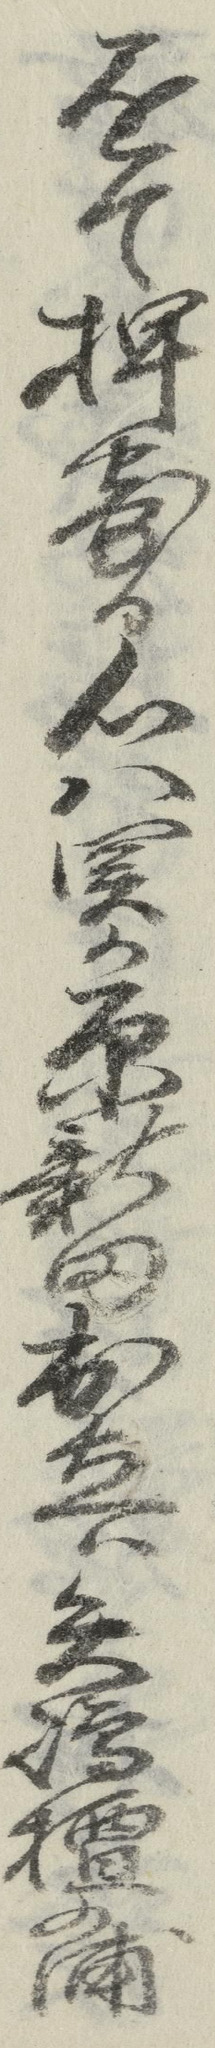懸て押寄る心は関か原新田出立は矢嶋壇の浦
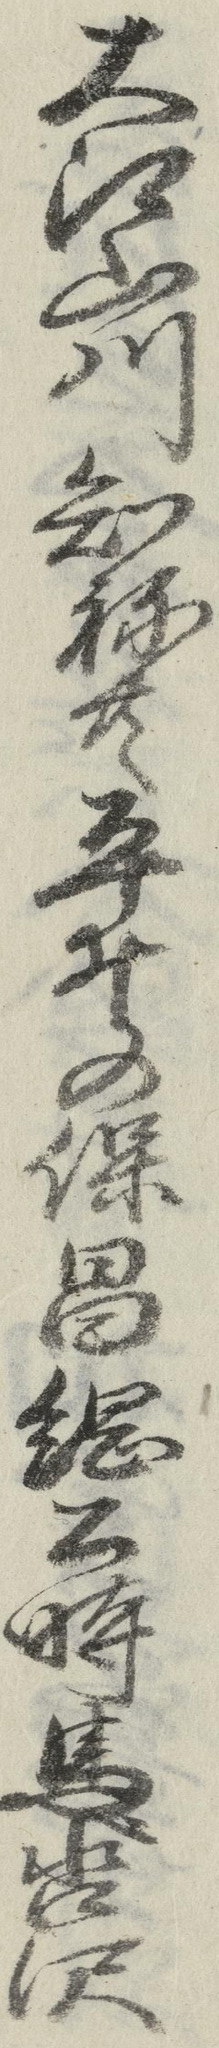大江山川知ね共平井の保昌綱公時馬沓沢
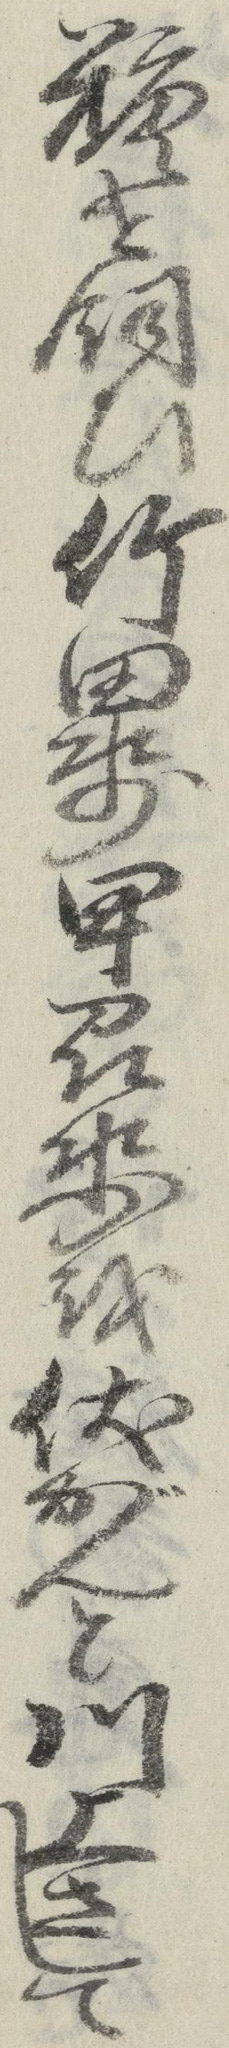糖を飼ひ竹田勢甲州勢を伏がんと川上さして
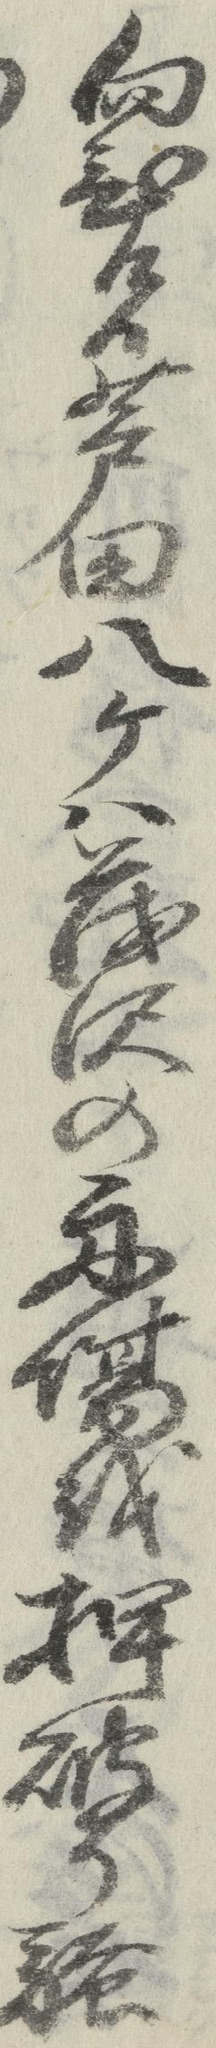向ひける芦田八ケは茂沢の舟場を押破り騒
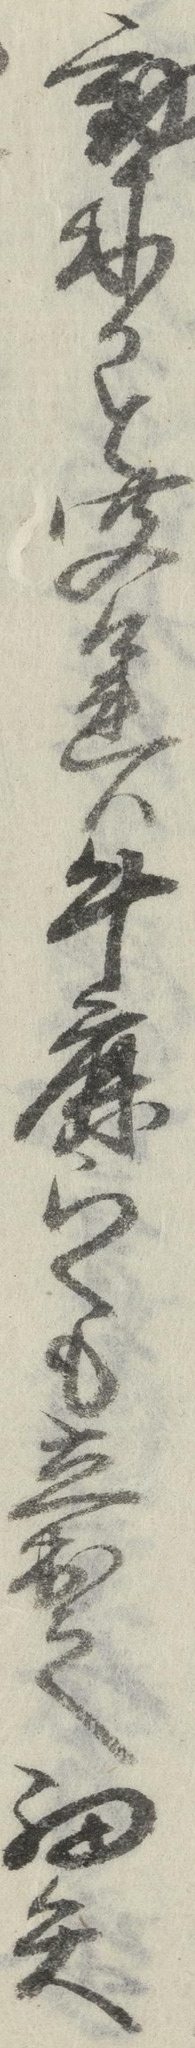動来りと聞けれは牛鹿いくも立出て細矢
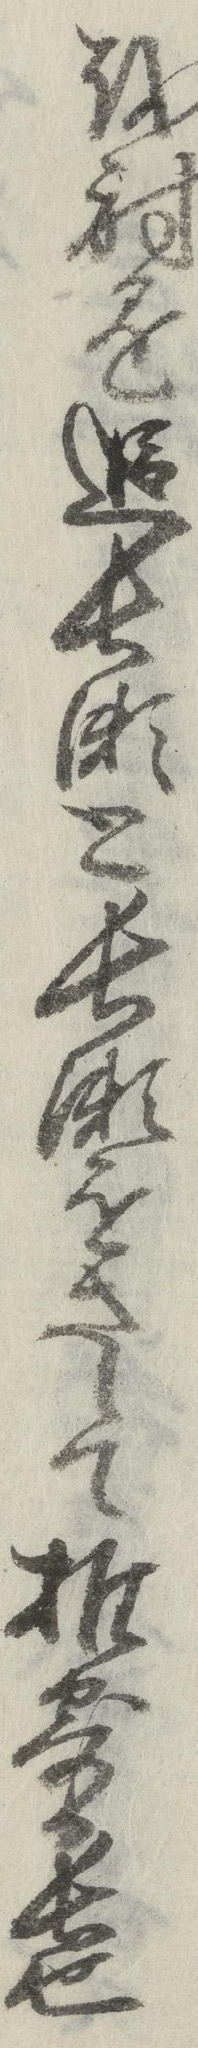を射懸追長瀬と長瀬をさして推寄る長せ
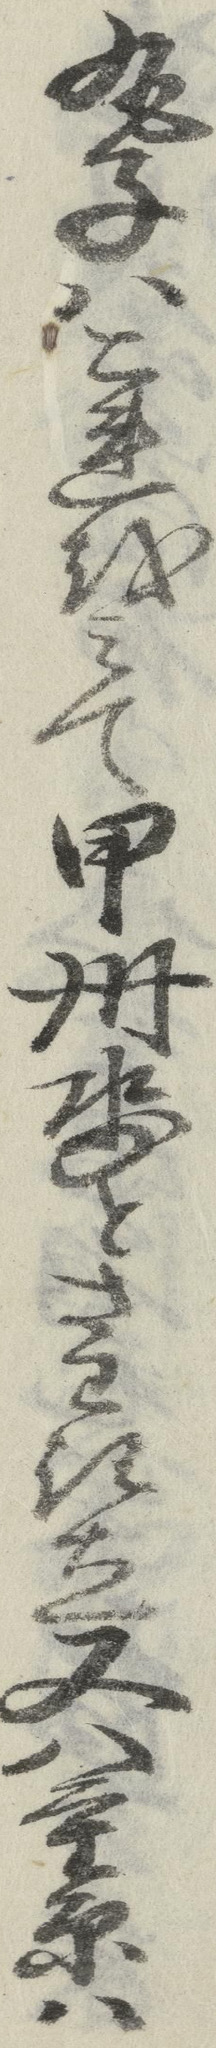丸子はこれをみて甲州勢とさわき立又八重原は
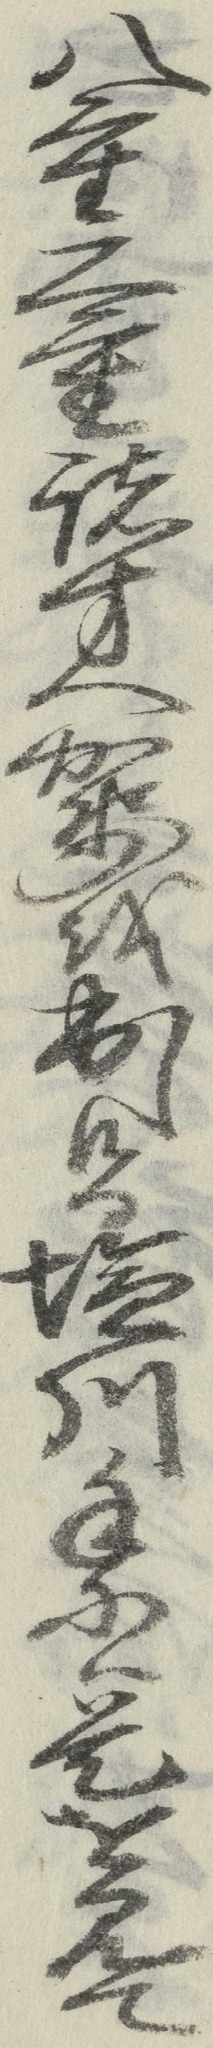八重二重諸方へ加勢を出しける塩川手には是を見て
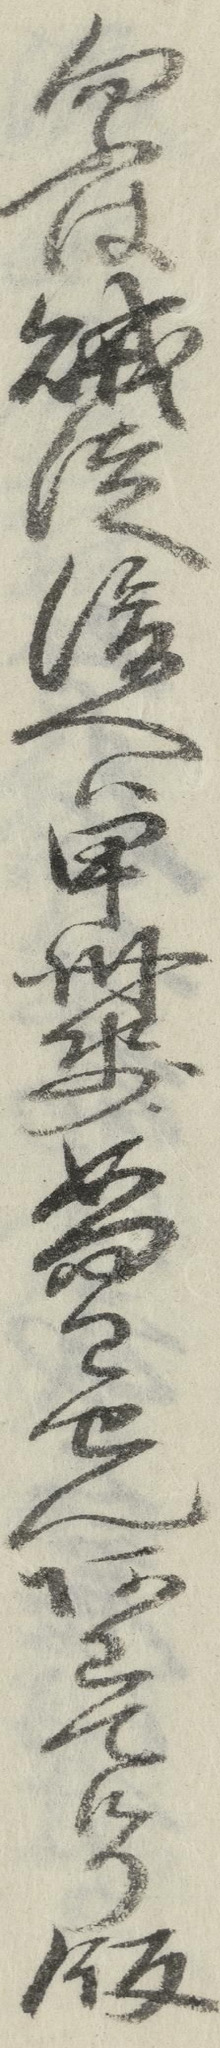向ふは賊徒後へは甲州勢如何わせんあわてけり飯
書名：浅間大焼騒動記　下
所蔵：東京大学地震研究所図書室 Earthquake Research Institute Library, The University of Tokyo, JAPAN
